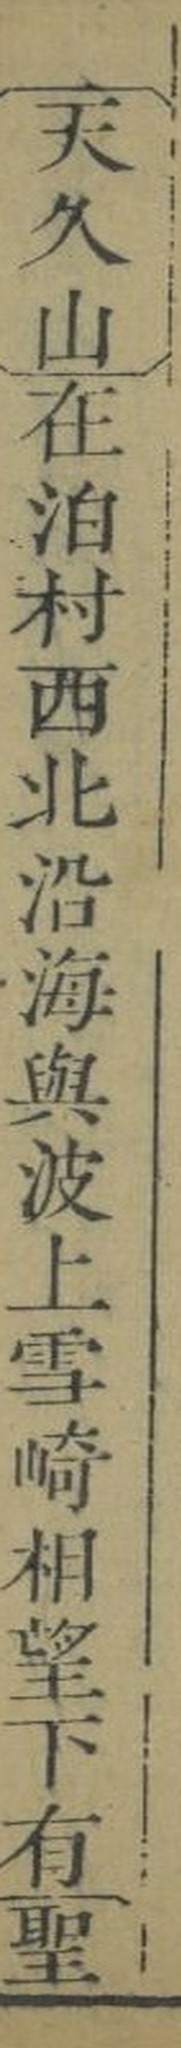[天久山]在泊村西北沿海与波上雪崎相望下有[聖
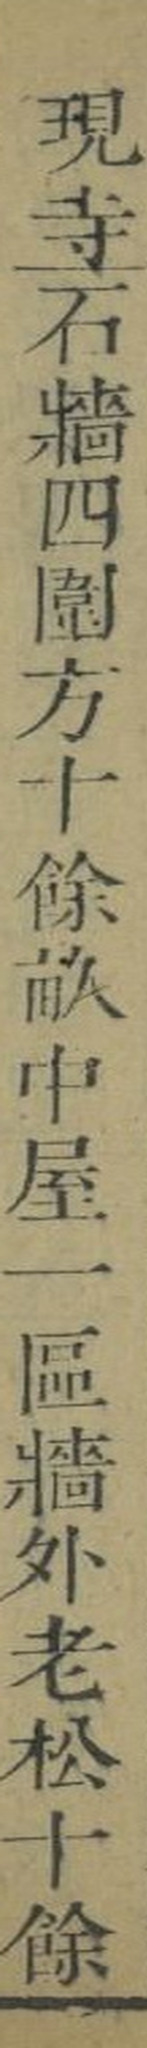現寺]石牆四囲方十余畝中屋一区牆外老松十余
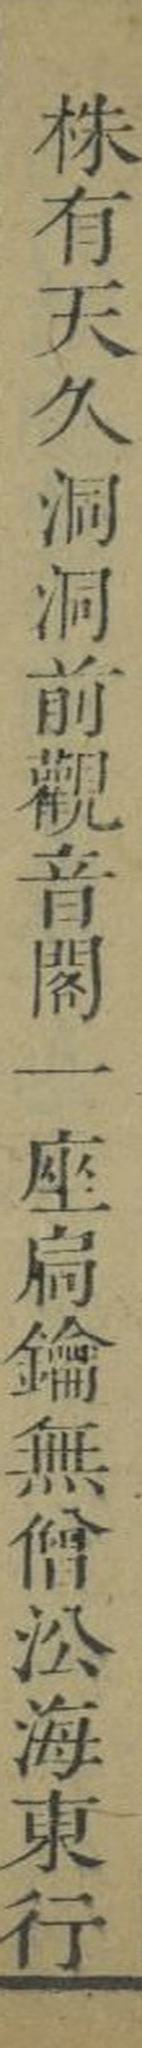株有天久洞洞前観音閣一座扃鑰無僧沿海東行
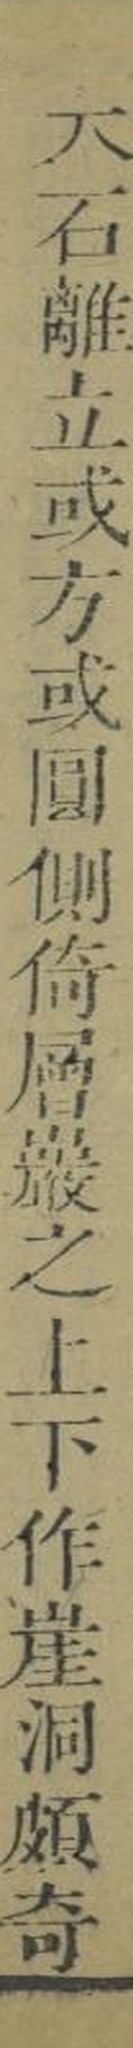大石離立或方或円側倚層巌之上下作崖洞頗奇
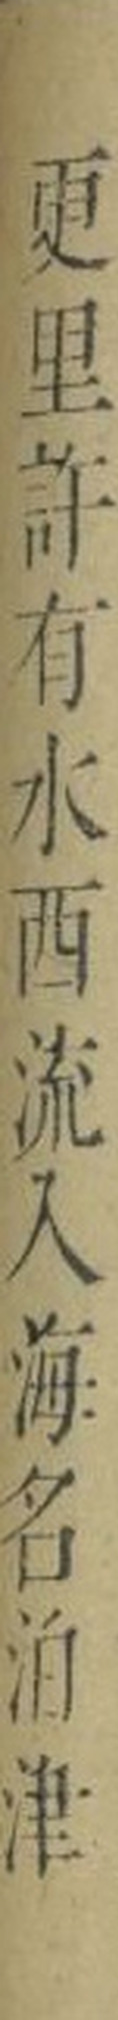更里許有水西流入海名泊津
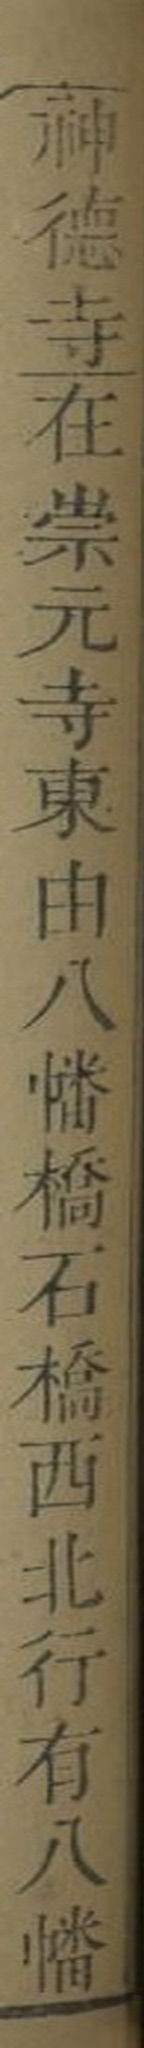[神徳寺]在崇元寺東由八幡橋石橋西北行有八幡
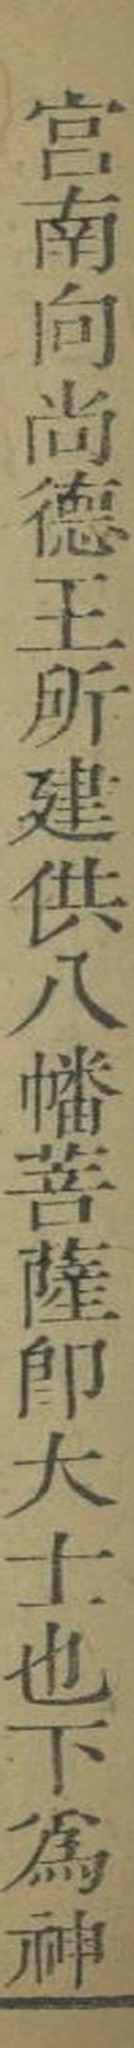宮南向尚徳王所建供八幡菩薩即大士也下為神
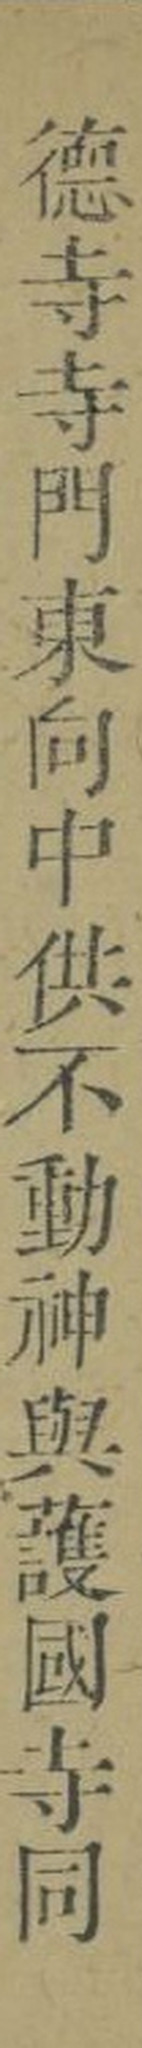徳寺寺門東向中供不動神与護国寺同
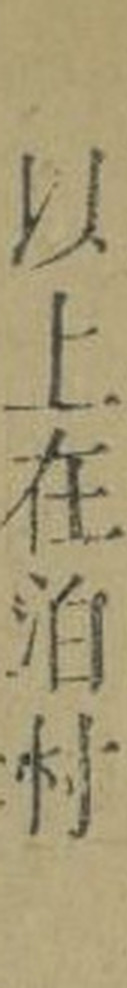以上在泊村
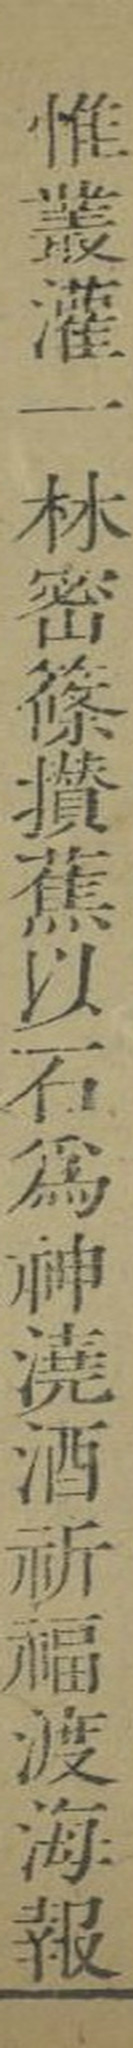惟叢灌一林密篠攢蕉以石為神澆酒祈福渡海報
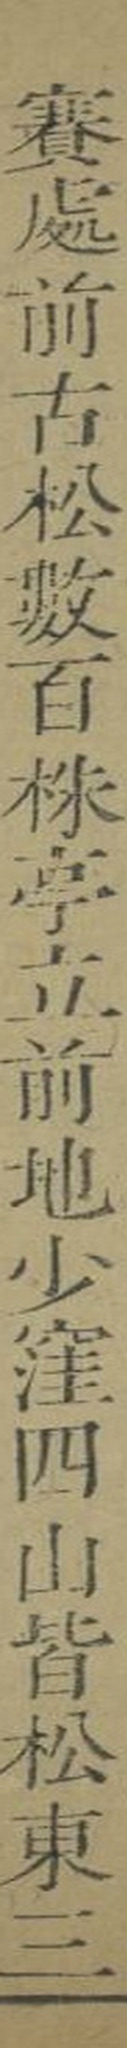賽処前古松数百株亭立前地少窪四山皆松東三
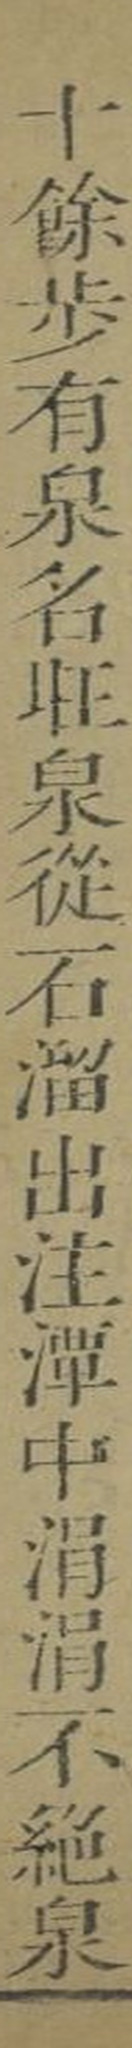十余歩有泉名旺泉従石溜出注潭中涓涓不絶泉
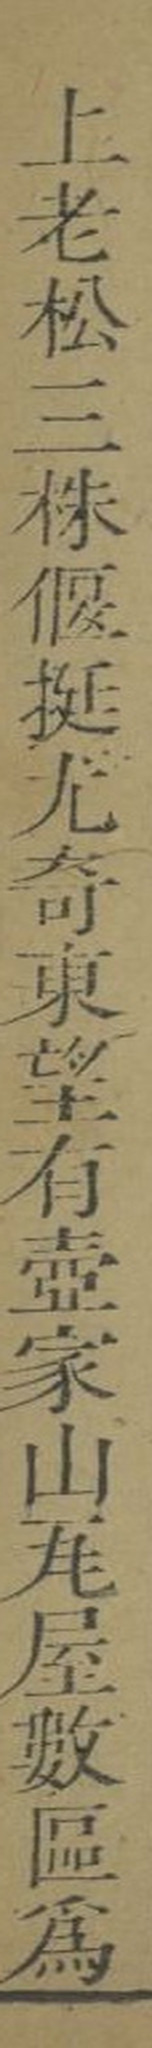上老松三株偃挺尤奇東望有壺家山瓦屋数区為

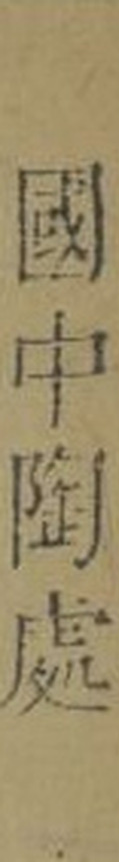国中陶処
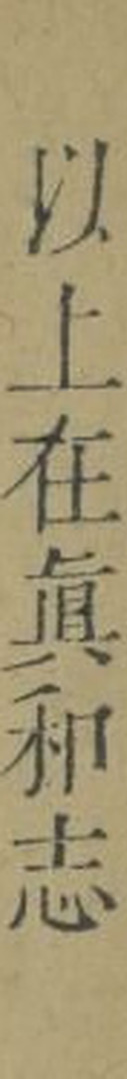以上在真和志
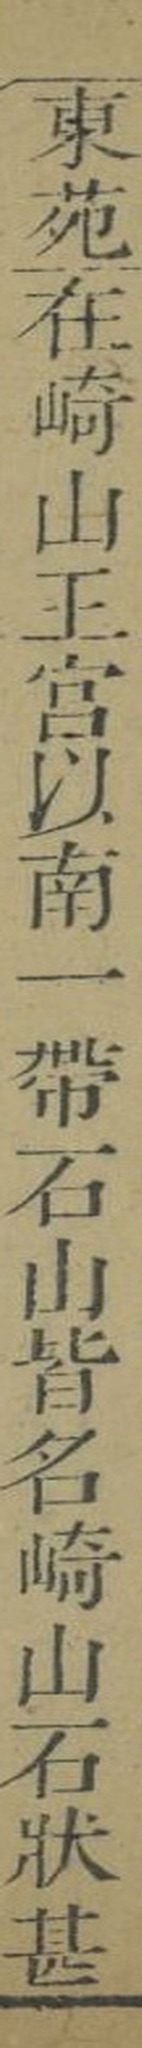[東苑]在崎山王宮以南一帯石山皆名崎山石状甚
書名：中山伝信録 巻四
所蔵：University of the Ryukyus Library
